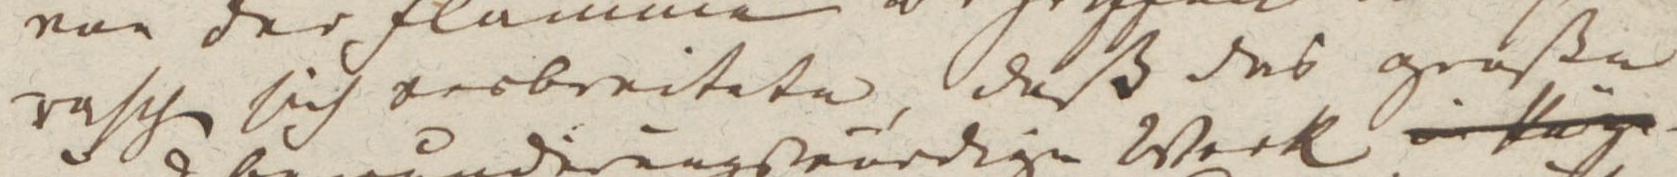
rasch sich verbreitete, dass das grosse
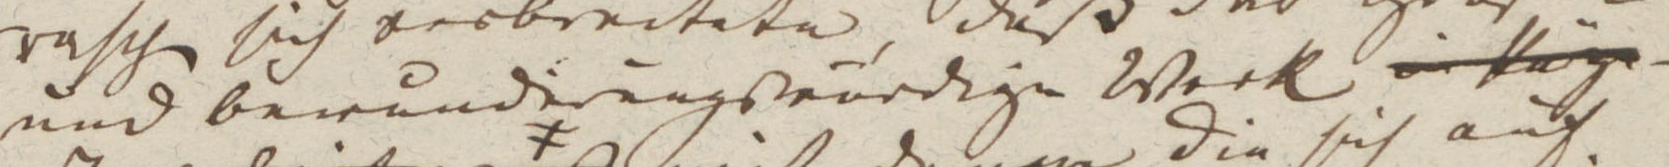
und bewunderungswürdige Werk in kürze-
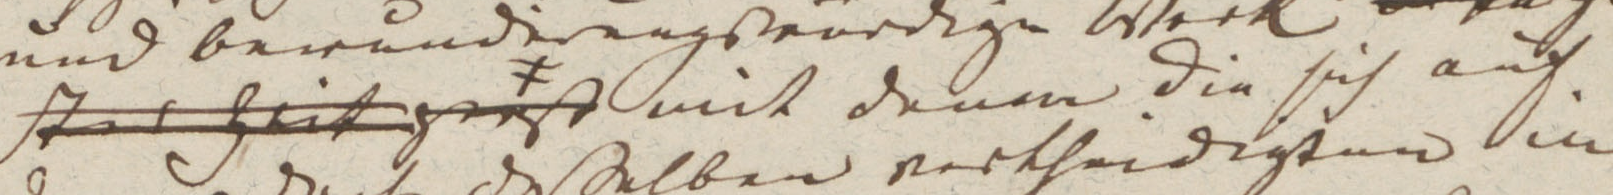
ster Zeit zerst % mit denen die sich auf
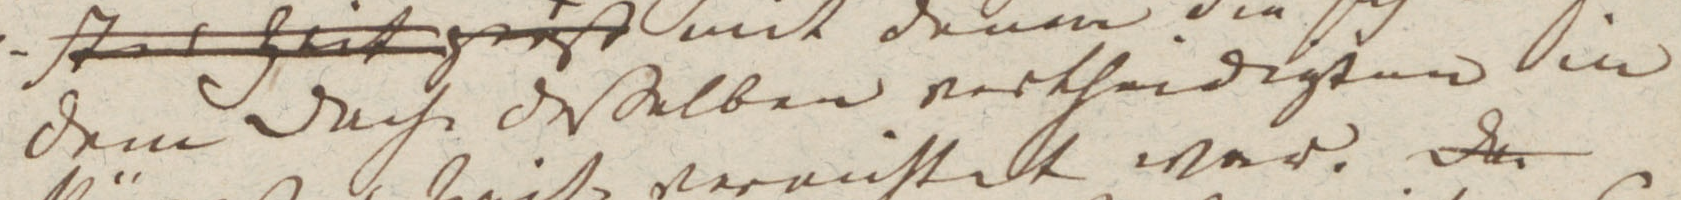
dem Dache desselben vertheidigten in
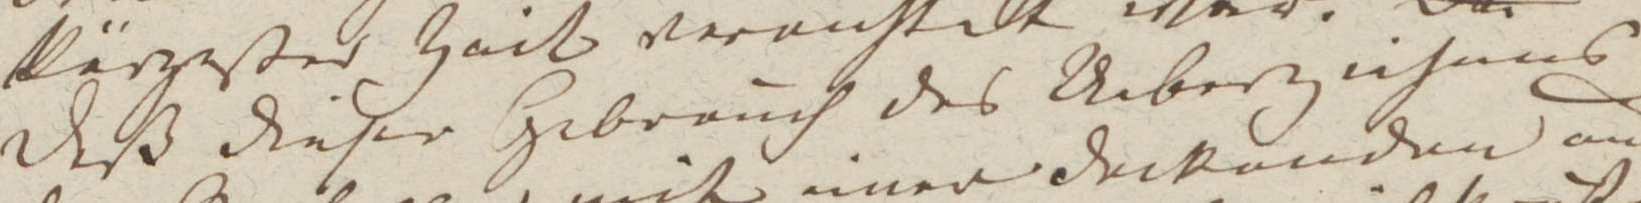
Dass dieser Gebrauch des Ueberziehens
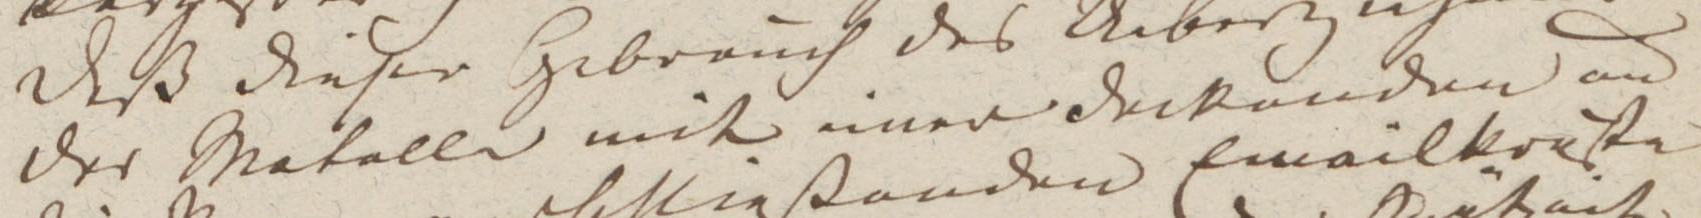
der Metalle mit einer deckenden und
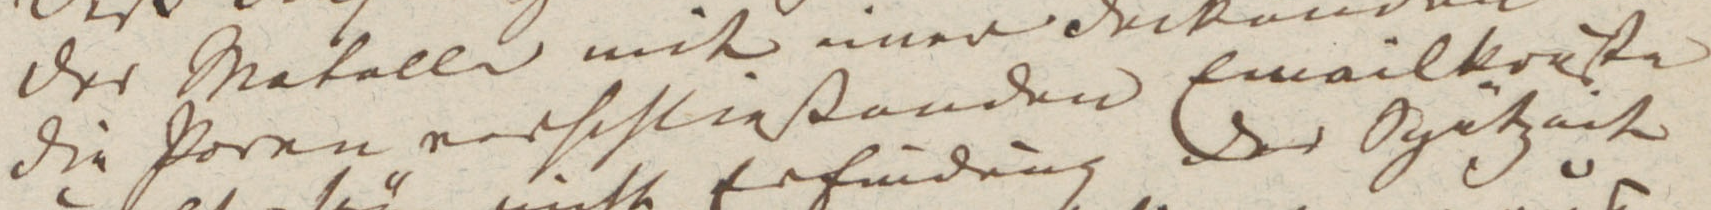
die Poren verschliessenden Emailkruste
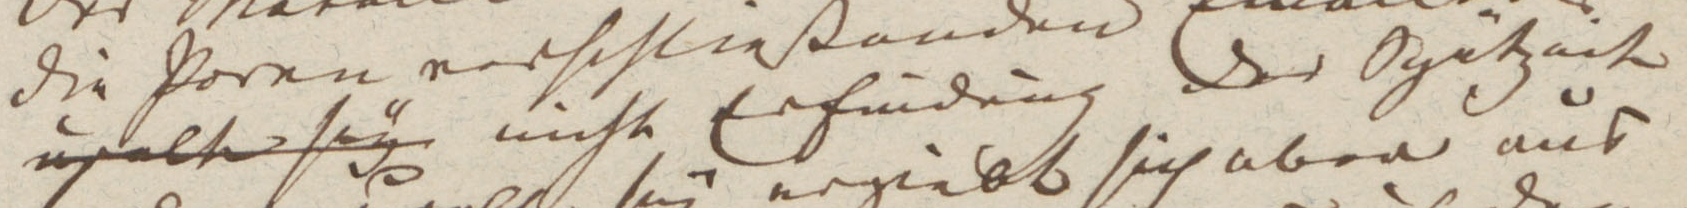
uralt sey nicht Erfindung der Spätzeit
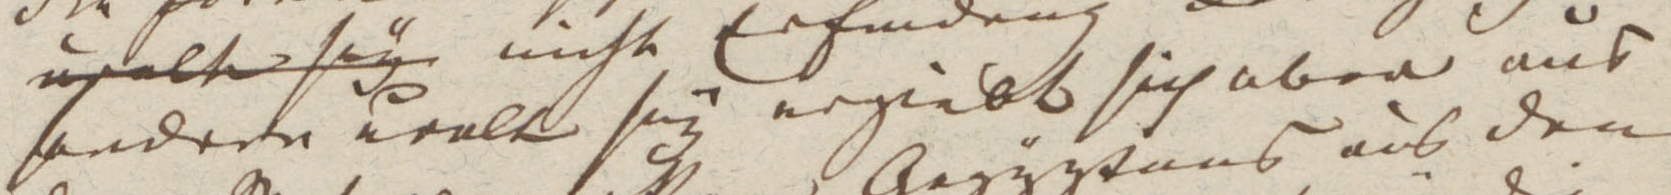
sondern uralt sey ergiebt sich aber aus
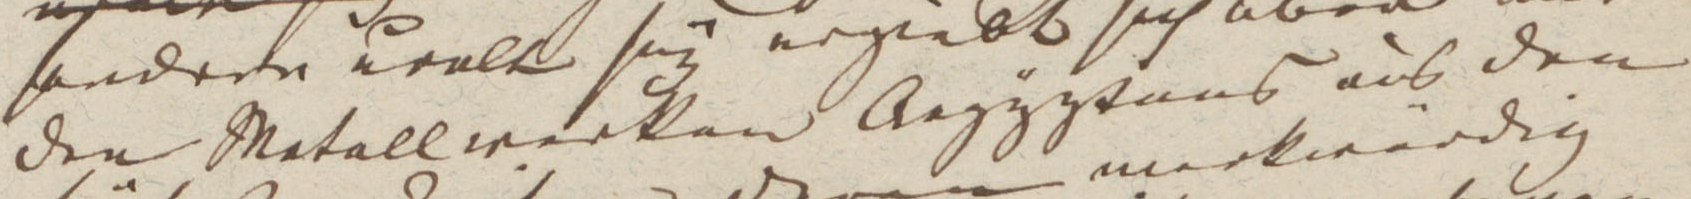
den Metallwerken Aegyptens aus den
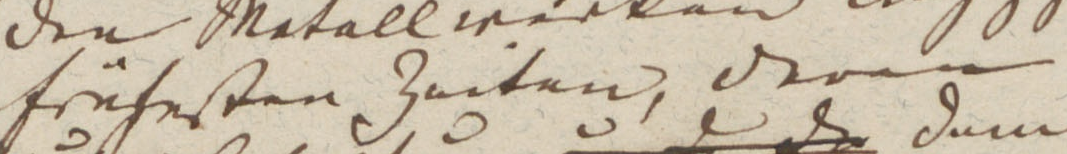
frühesten Zeiten, deren
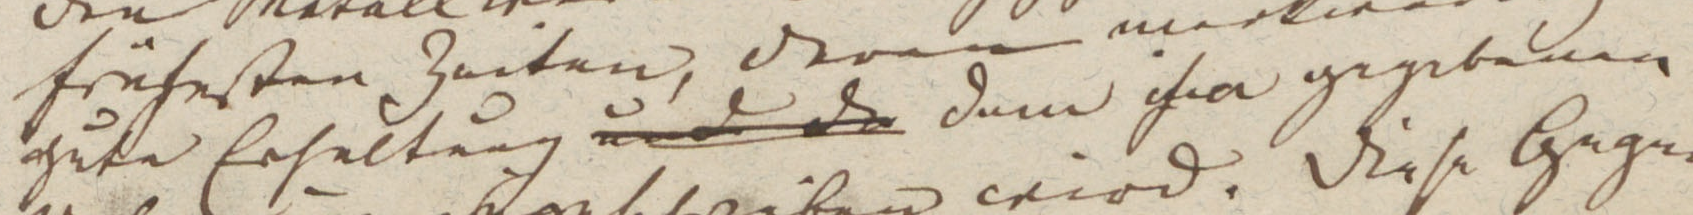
gute Erhaltung und di dem imhm gegebenen
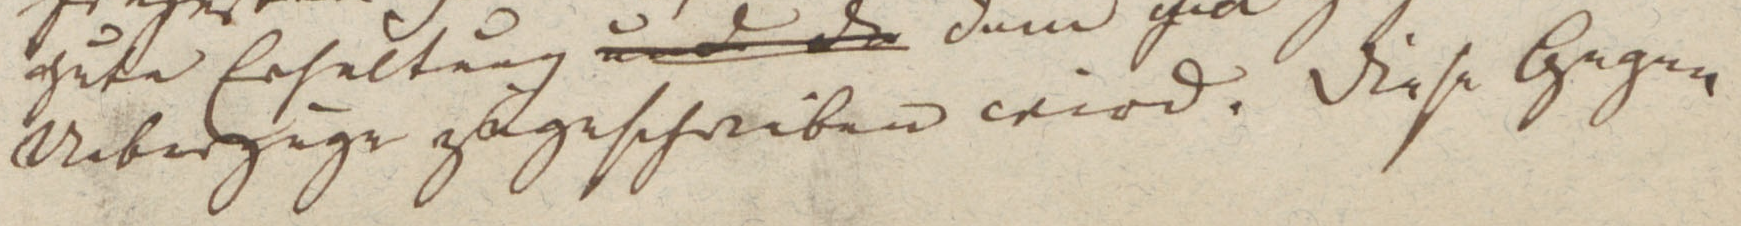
Ueberzuge zugeschrieben wird. Diese Gegen
